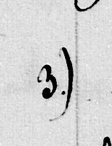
3.)
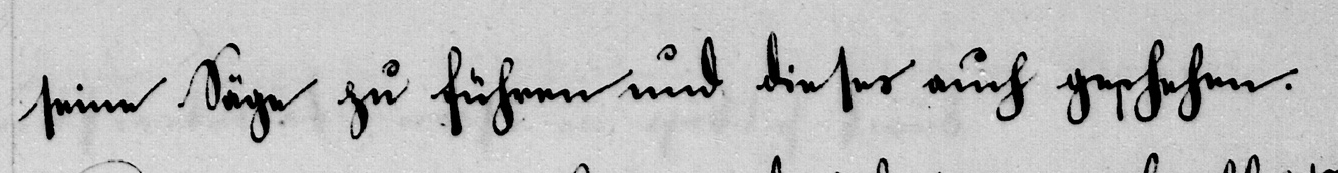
seine Säge zu führen und dieses auch geschehen.
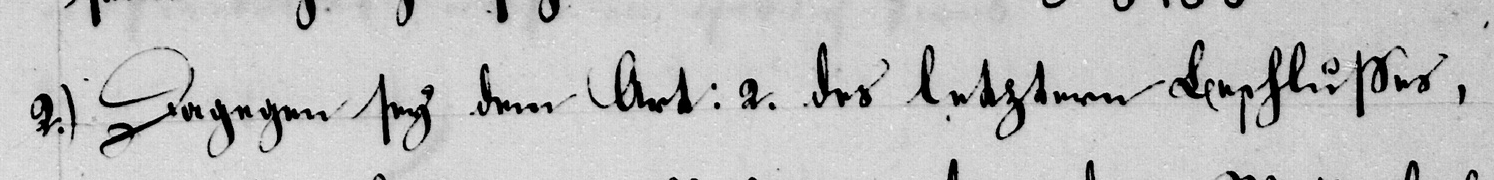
2.) Dagegen sey dem Art: 2. des letztern Beschlußes,
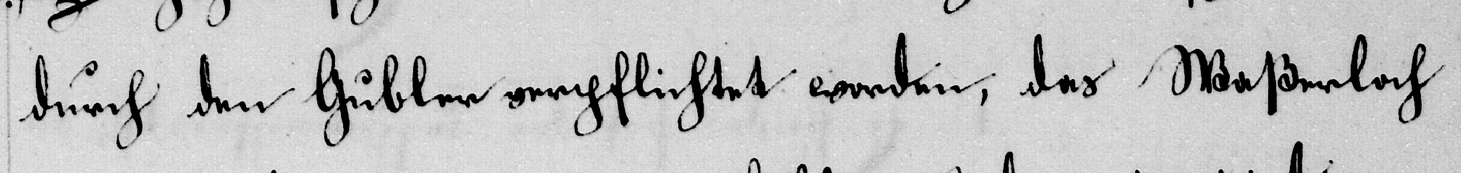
durch den Gubler verpflichtet worden, das Waßerloch
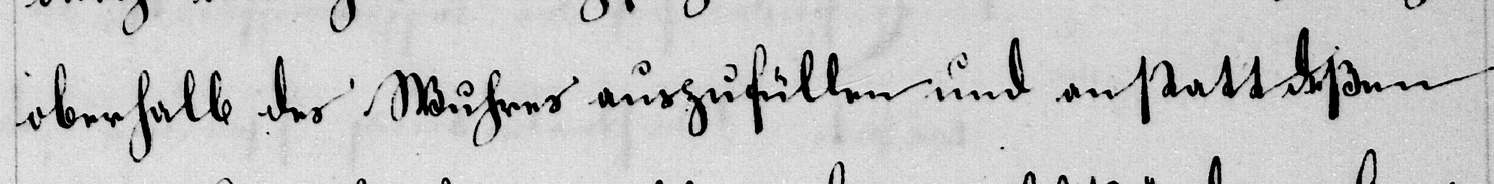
oberhalb des Wuhres auszufüllen und anstatt deßen
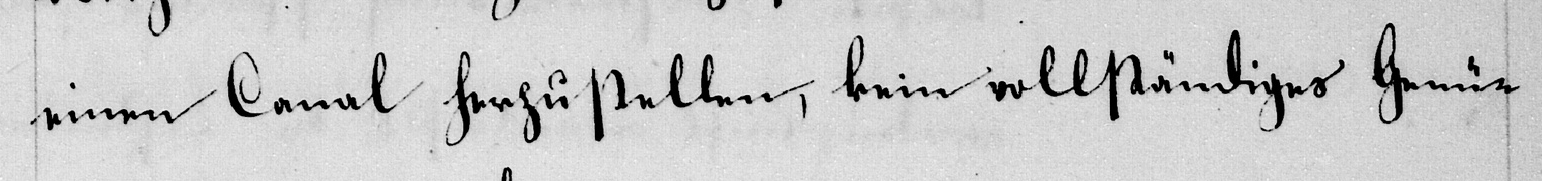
einen Canal herzustellen, kein vollständiges Genü¬
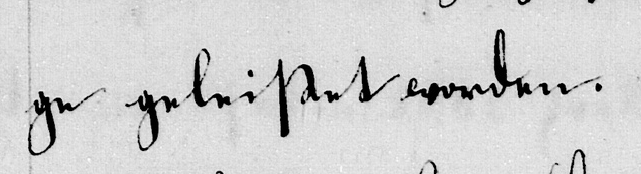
gen geleistet worden.
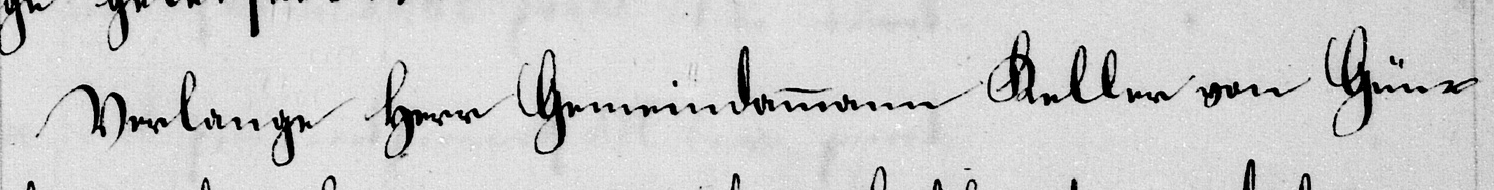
Verlange Herr Gemeindammann Keller von Gün¬
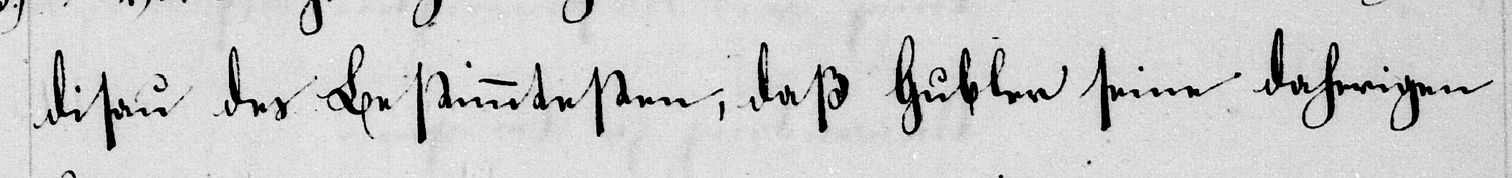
disau des Bestimmtesten, daß Gubler seine daherigen
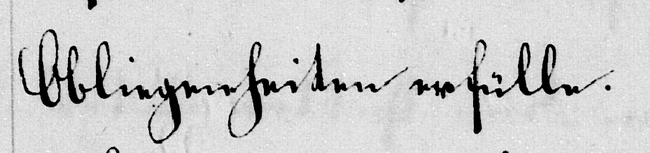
Obliegenheiten erfülle.
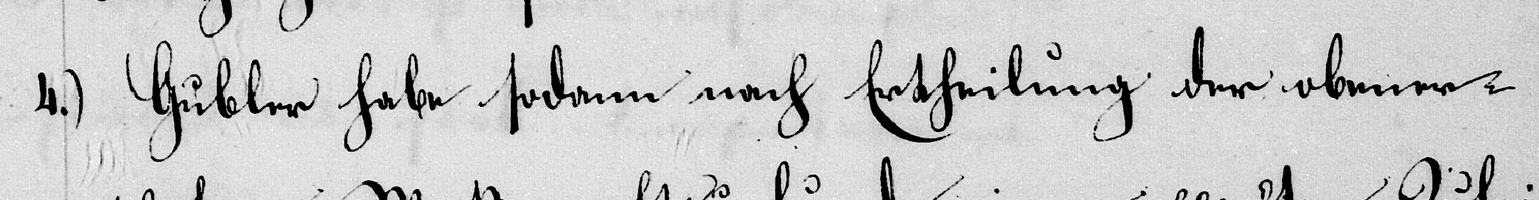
4.) Gubler habe sodann nach Ertheilung der obener¬
